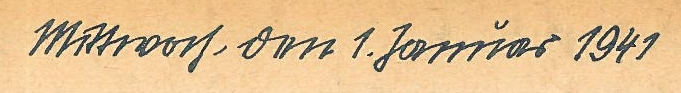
Mittwoch, den 1. Januar 1941
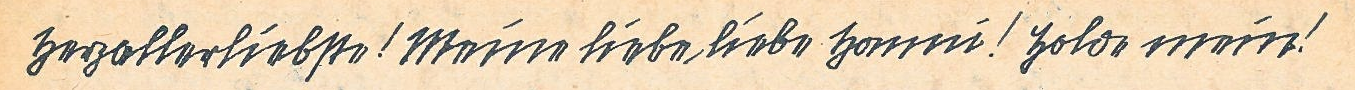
Herzallerliebste! Meine liebe, liebe! Holde mein!
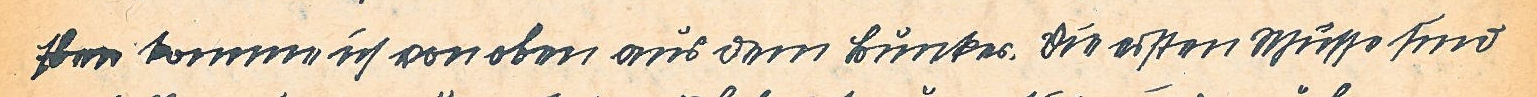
Eben komme ich von oben aus dem Bunker. Die ersten Schüsse sind
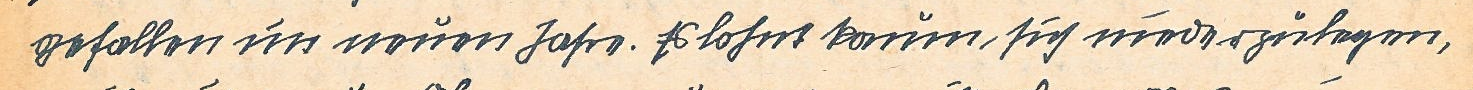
gefallen im neuen Jahre. Es lohnt kaum, sich niederzulegen,
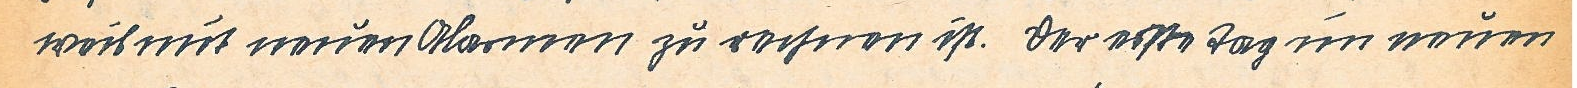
weil mit neuen Alarmen zu rechnen ist. Der erste Tag im neuen
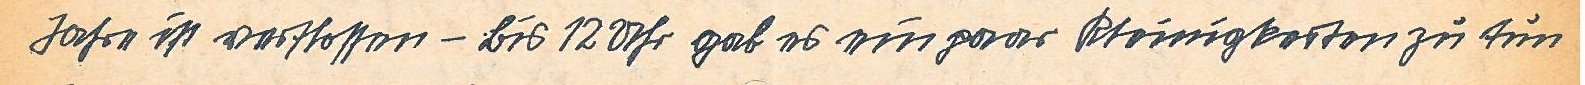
Jahre ist verflossen – bis 12 Uhr gab es ein paar Kleinigkeiten zu tun
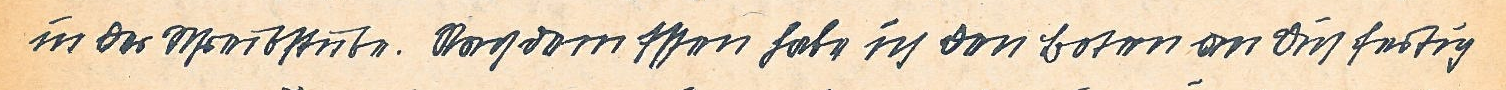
in der Schreibstube. Nach dem Essen habe ich den Boten an Dich fertig
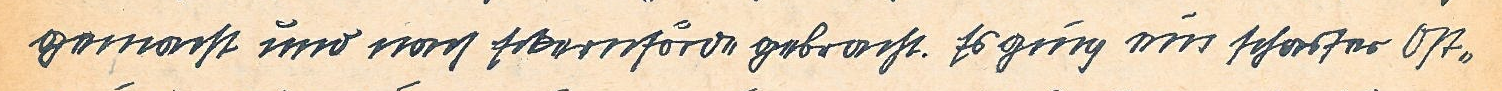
gemacht und nach Eckernförde gebracht. Es ging ein scharfer Ost¬
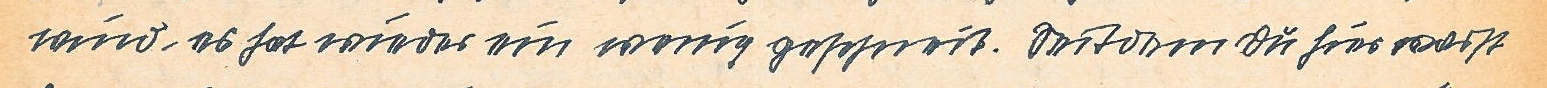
wind, es hat wieder ein wenig geschneit. Seitdem Du hier warst
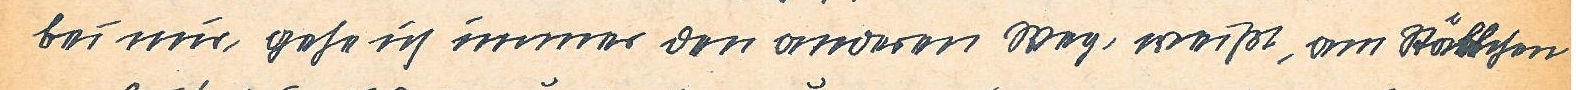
bei mir, gehe ich immer den anderen Weg, weißt, am Ställchen
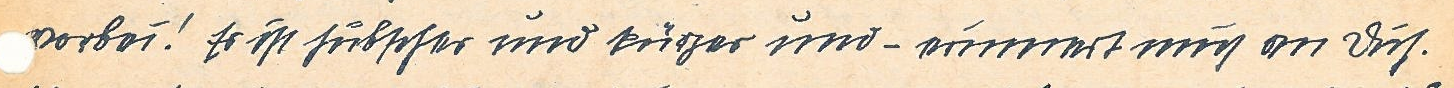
vorbei! Es ist hübscher und kürzer und – erinnert mich an Dich.
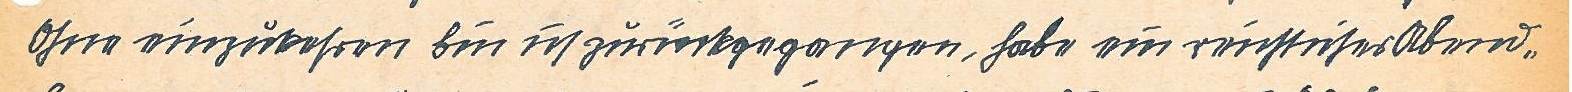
Ohne einzukehren bin ich zurückgegangen, habe ein reichliches Abend¬
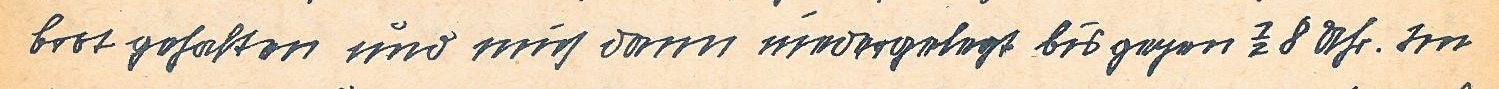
brot gehalten und mich dann niedergelegt bis gegen ½ 8 Uhr. Im
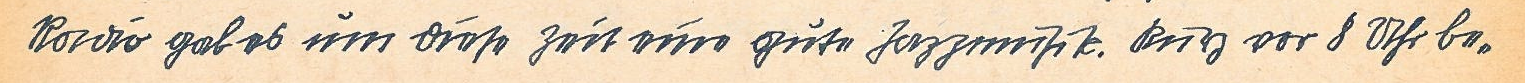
Radio gab es um diese Zeit eine gute Jazzmusik. Kurz vor 8 Uhr be¬
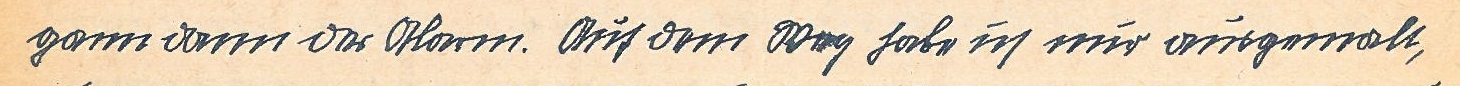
gann dann der Alarm. Auf dem Weg habe ich mir ausgemalt,
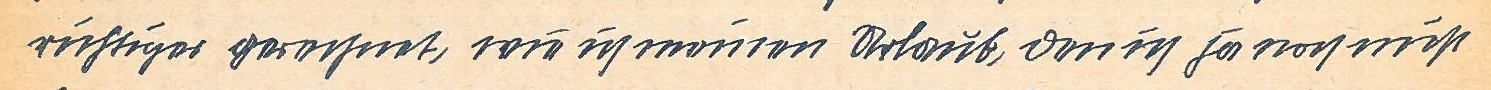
richtiger gerechnet, wie ich meinen Urlaub, den ich ja noch nicht
